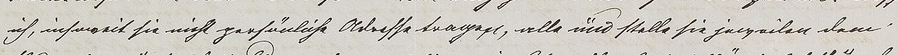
ich, insoweit sie nicht persönliche Adresse tragen, alle und stelle sie jeweilen dem
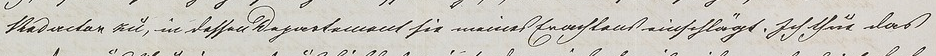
Redactor zu, in dessen Departement sie meines Erachtens einschlägt. Ich thue das
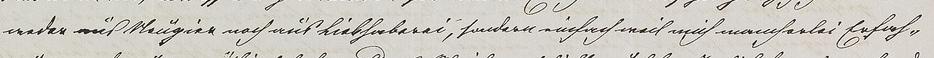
weder aus Neugier noch aus Liebhaberei, sondern einfach weil mich mancherlei Erfah-
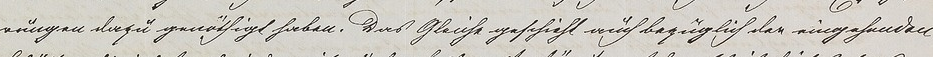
rungen dazu genöthigt haben. Das Gleiche geschieht auch bezüglich der eingehenden
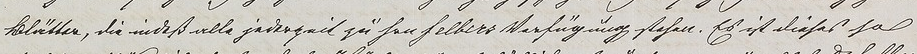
Blätter, die indeß alle jederzeit zu Hrn Felbers Verfügung stehen. Es ist dieses so
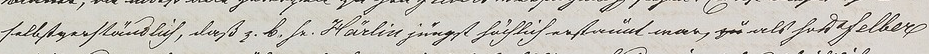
selbstverständlich, daß z. B. Hr. Härlin jüngst höchlich erstaunt war, zu als Hr DrFelber
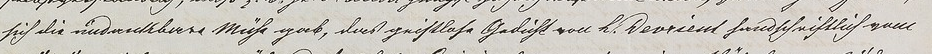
sich die undankbare Mühe gab, das geistlose Gedicht von L. Devrient handschriftlich vom
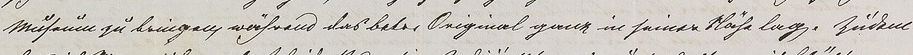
Museum zu bringen, während das betr. Original ganz in seiner Nähe lag. Zudem
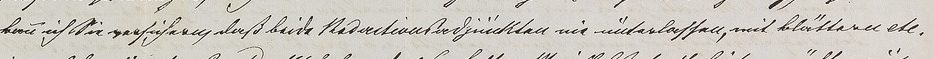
kann ich Sie versichern, daß beide Redactionsadjunkten nie unterlassen, mit Blättern etc.
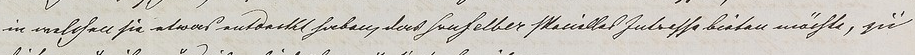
in welchen sie etwas entdeckt haben, das Hrn Felber spezielles Intresse bieten möchte, zu
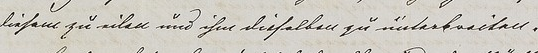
diesem zu eilen und ihm dieselben zu unterbreiten.
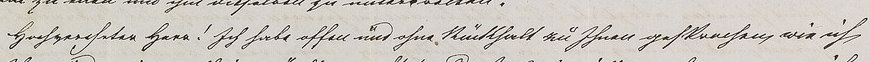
Hochverehrter Herr! Ich habe offen und ohne Rückhalt zu Ihnen gesprochen, wie ich
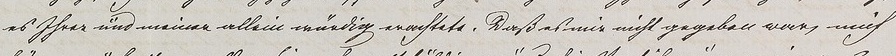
es Ihrer und meiner allein würdig erachtete. Daß es mir nicht gegeben war, mich
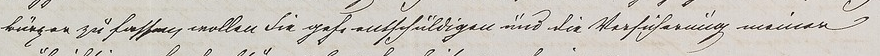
kürzer zu fassen, wollen Sie gef. entschuldigen und die Versicherung meiner
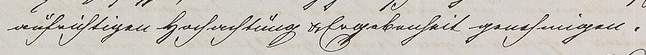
aufrichtigen Hochachtung & Ergebenheit genehmigen.
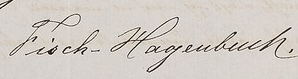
Fisch-Hagenbuch.
